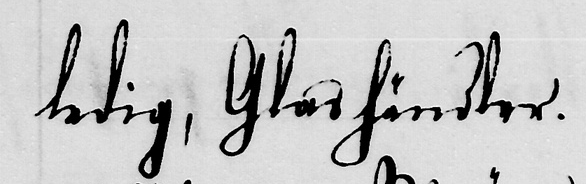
ledig, Glashändler.
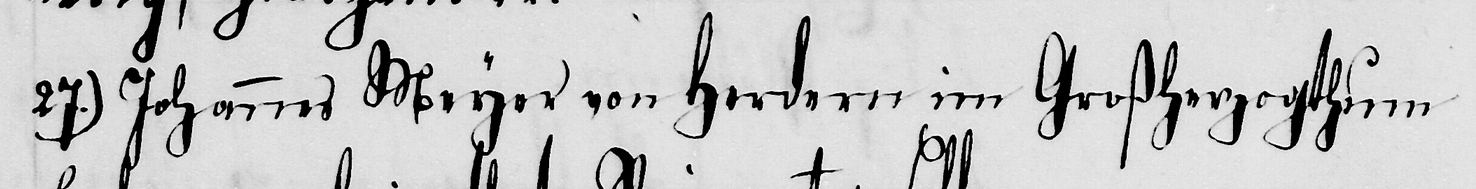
27.) Johannes Meyer von Herdern im Großherzogthum
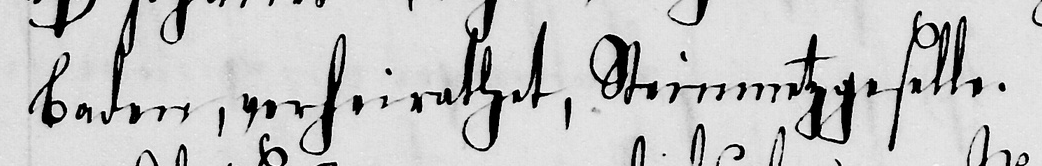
Baden, verheirathet, Steinmetzgeselle.
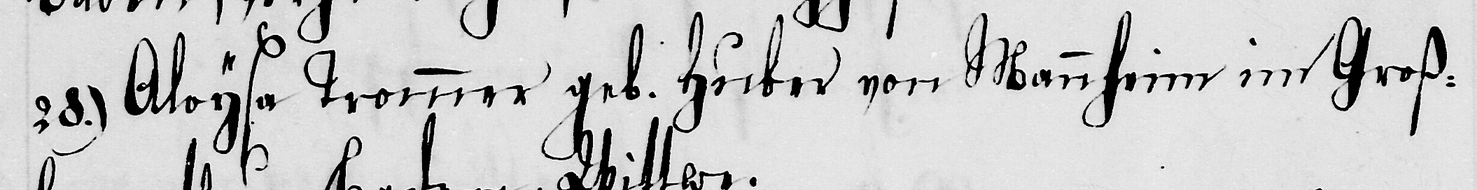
28.) Aloysa Trommer geb. Huber von Mannheim im Groß¬
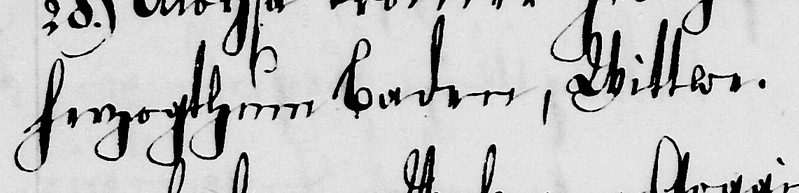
herzogthum Baden, Wittwe.
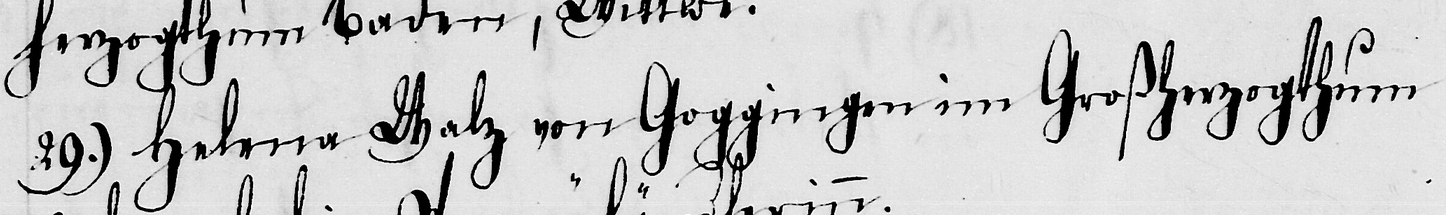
29.) Helena Walz von Goggingen im Großherzogthum
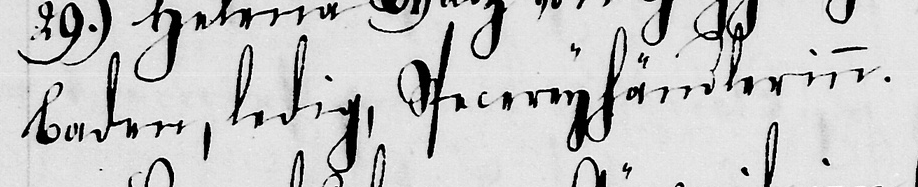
Baden, ledig, Specereyhändlerinn.
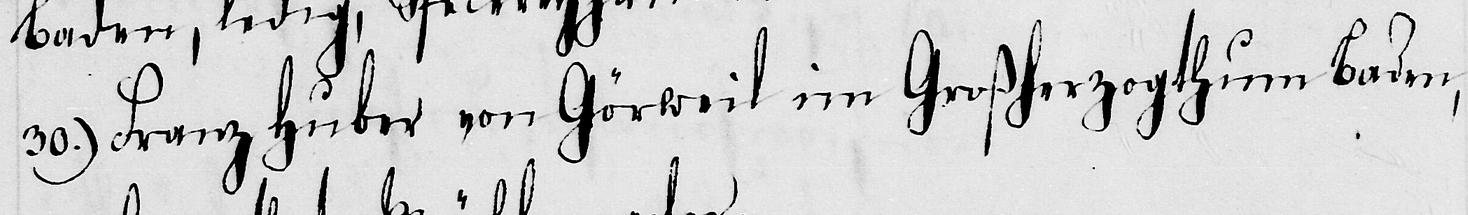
30.) Franz Huber von Görweil im Großherzogthum Baden,
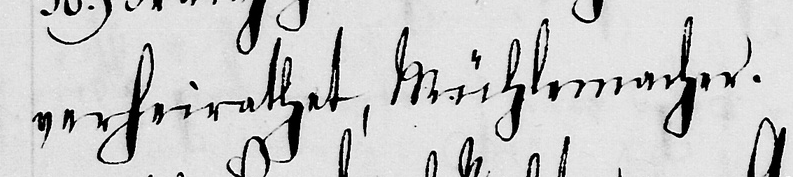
verheirathet, Mühlemacher.
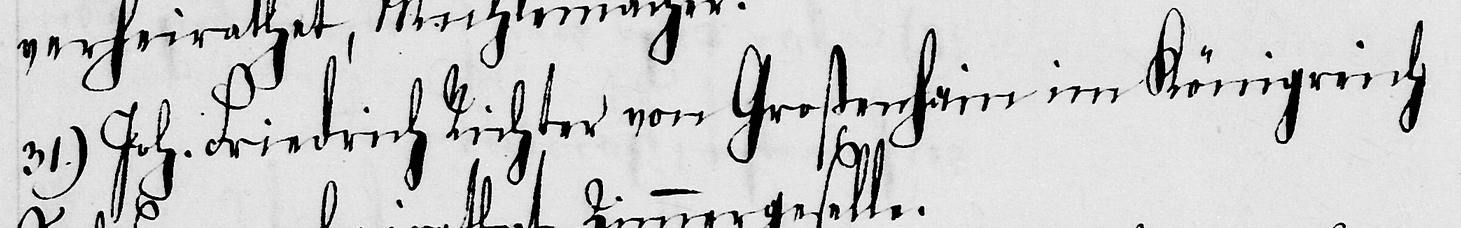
31.) Joh. Friedrich Richter von Großenhain im Königreich
